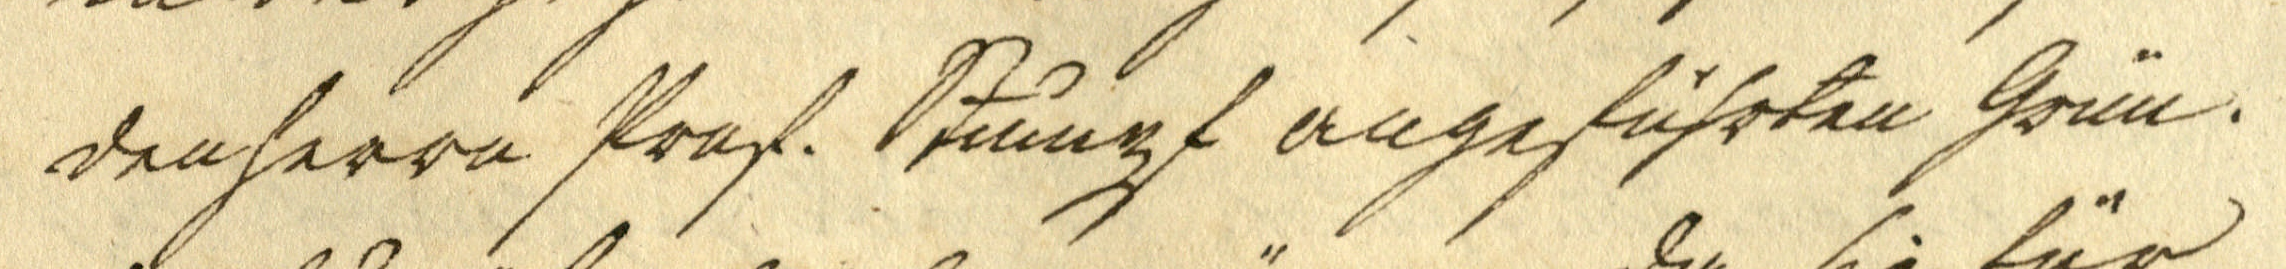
den Herrn Prof. Stumpf angeführten Grün¬
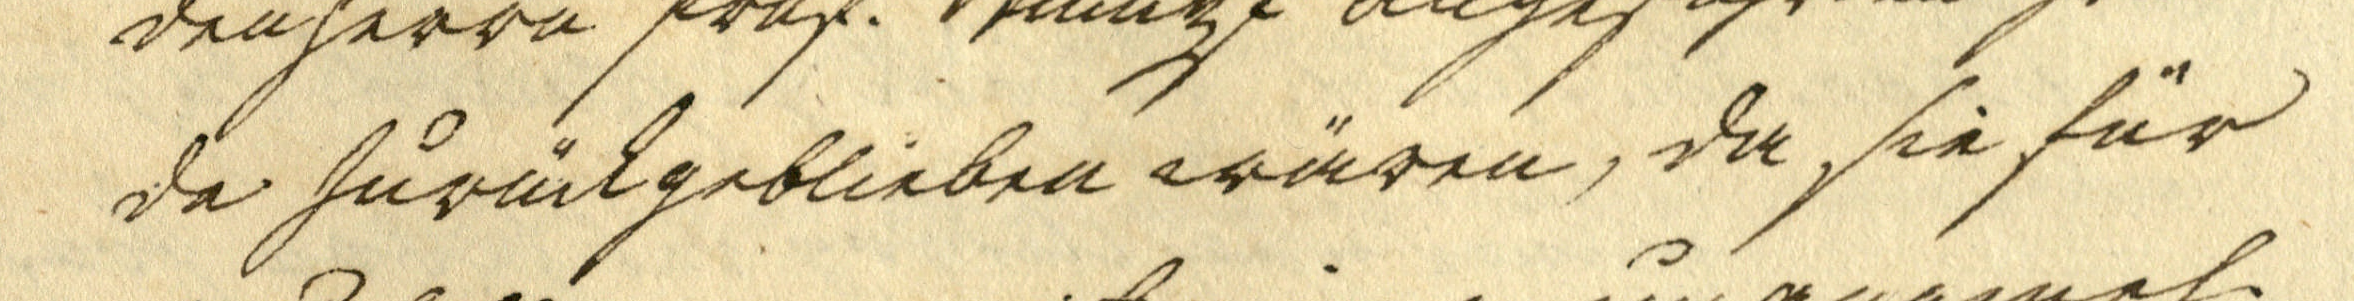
de zurückgeblieben wären, da sie für
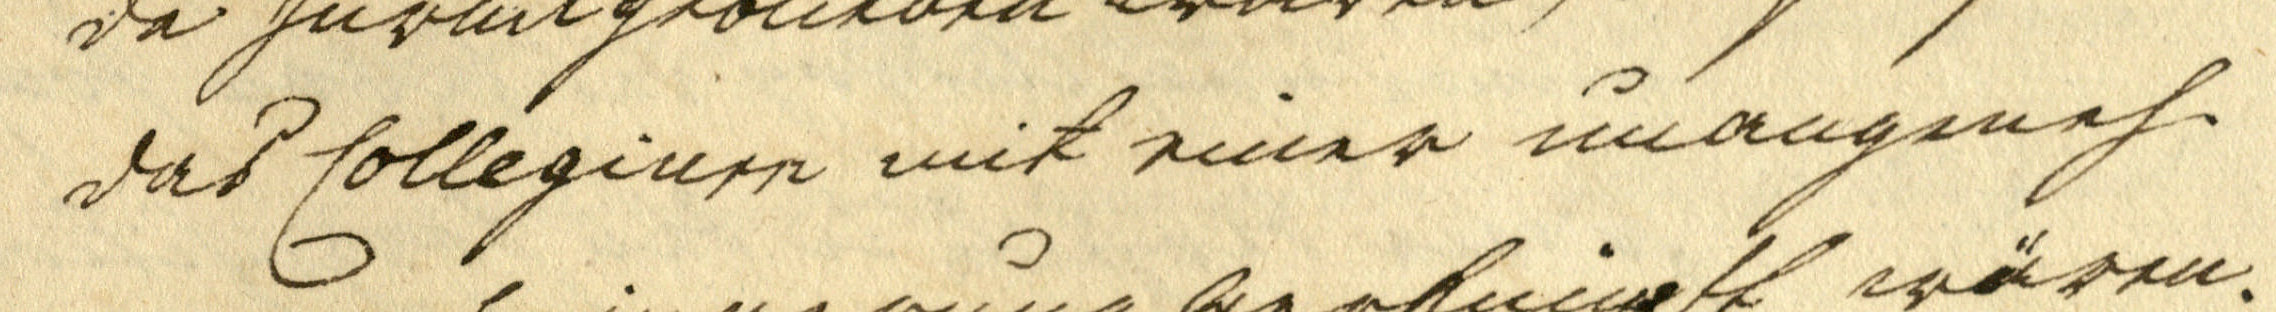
das Collegium mit einer unangeneh¬
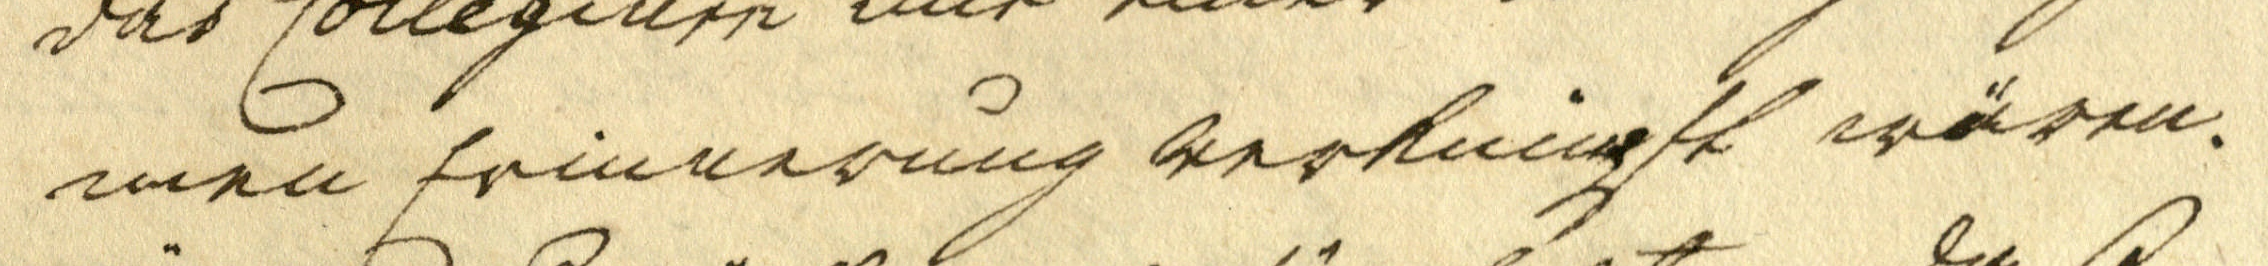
men Erinnerung verknüpft wären.
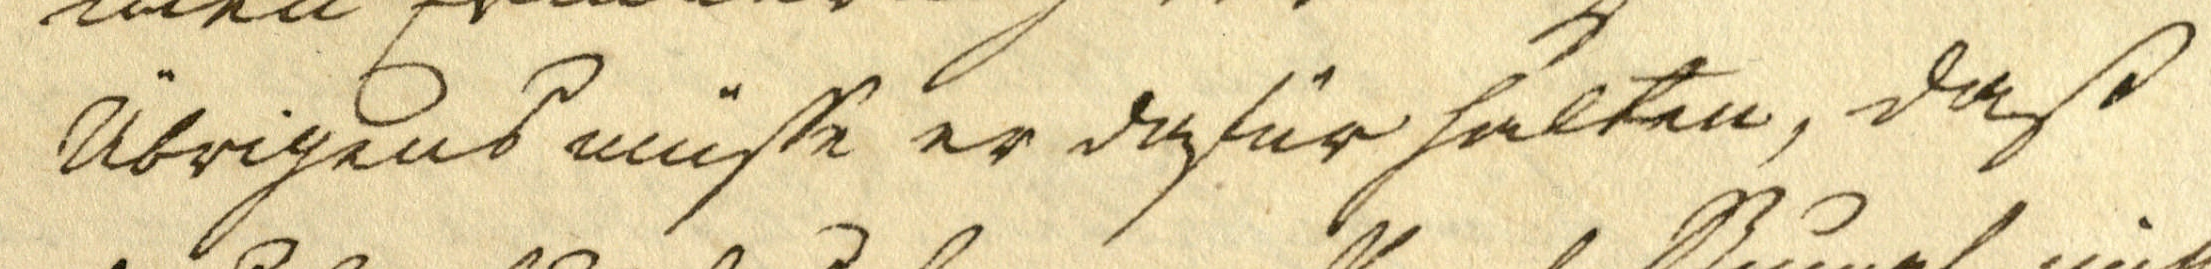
Übrigens müsse er dafür halten, daß
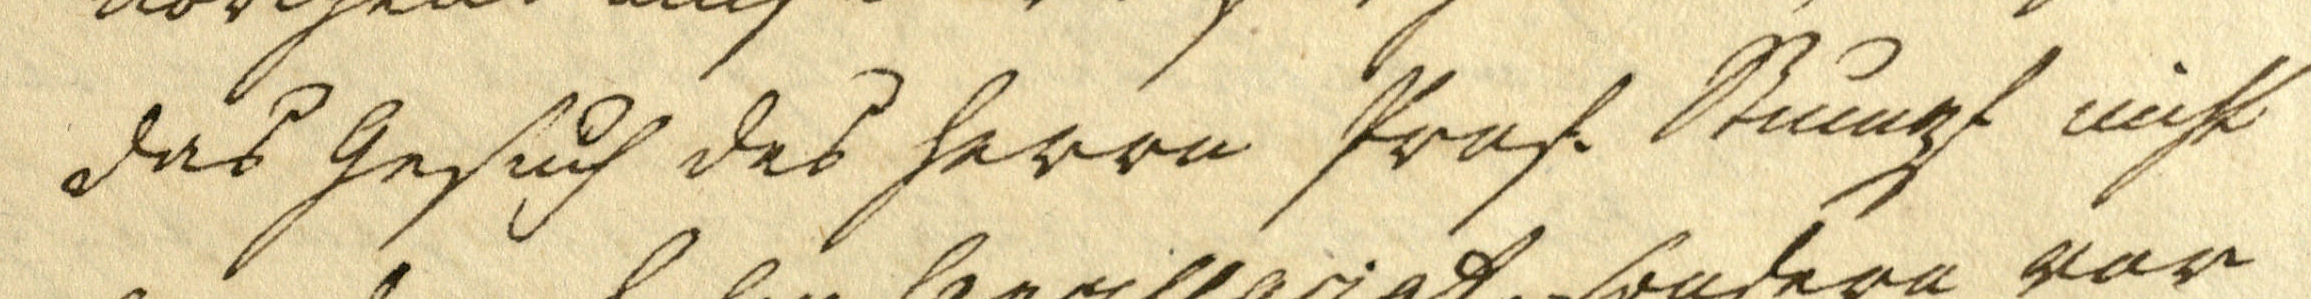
das Gesuch des Herrn Prof. Stumpf nicht
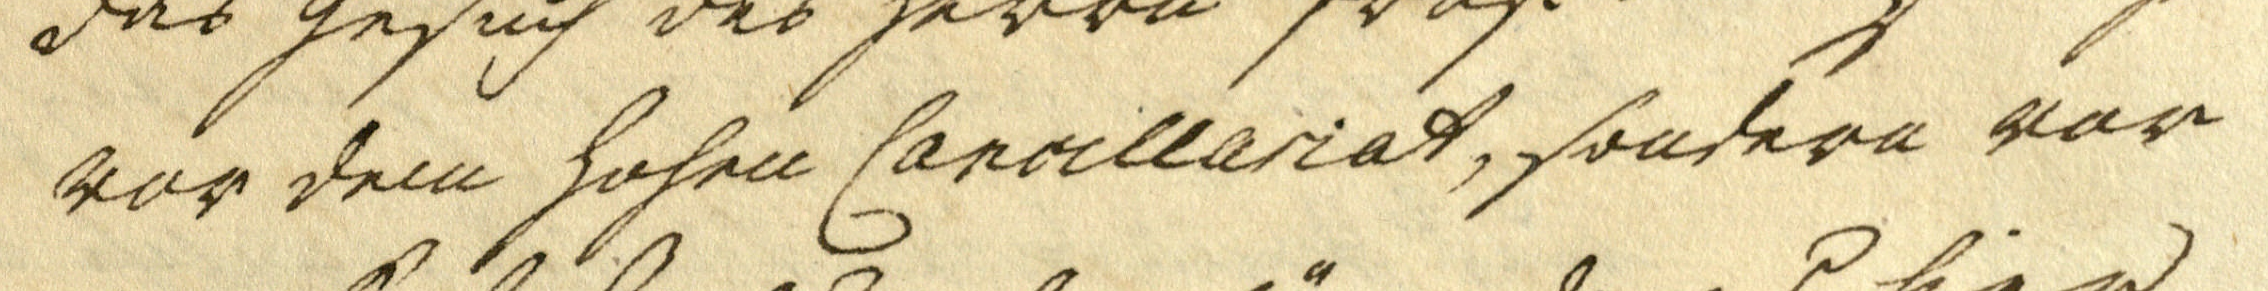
vor dem Hohen Cancellariat, sondern vor
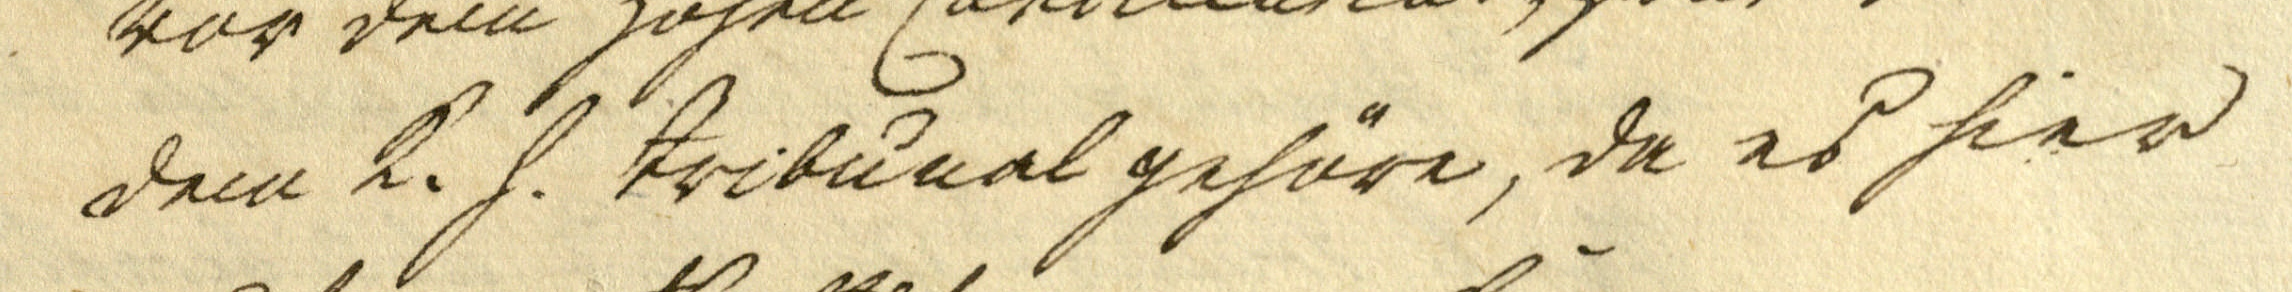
dem K. H. Tribunal gehöre, da es hier
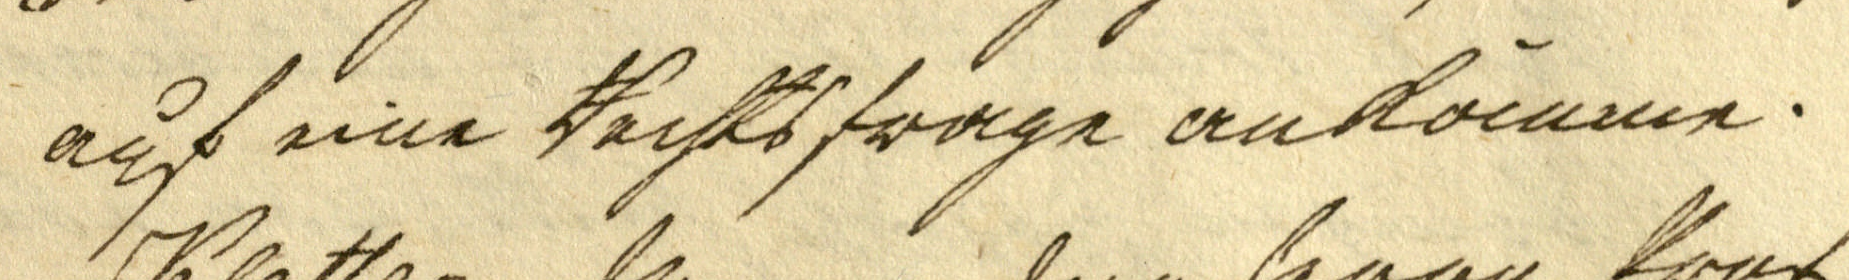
auf eine Rechts frage ankomme.
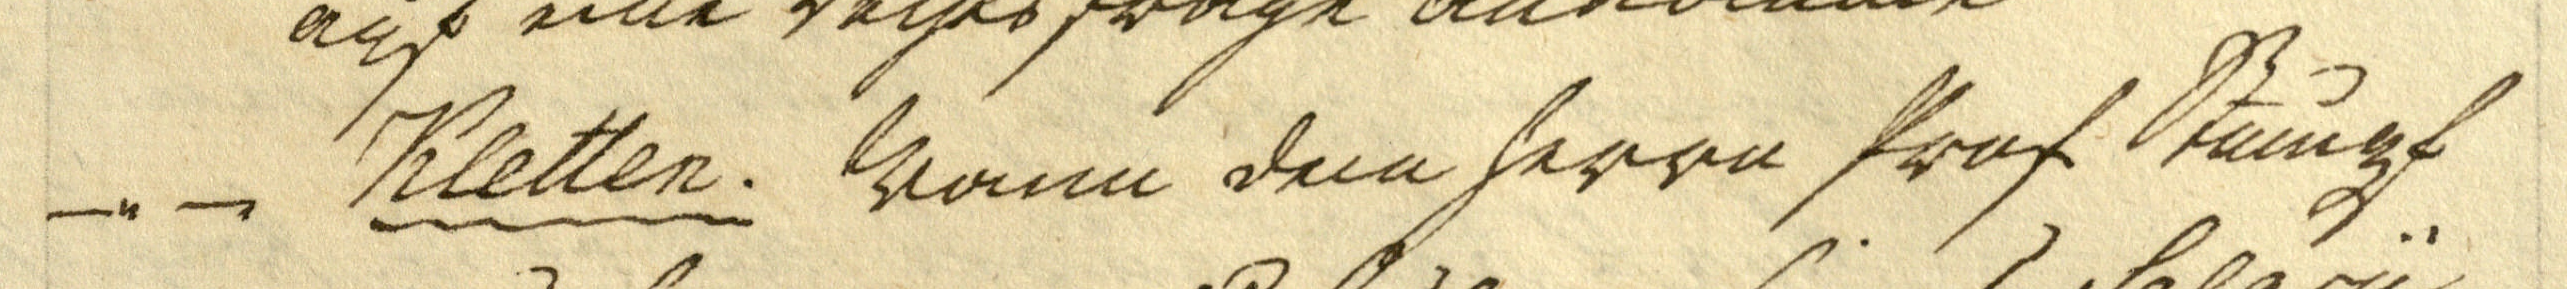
Kletten. Wann dem Herrn Prof. Stumpf
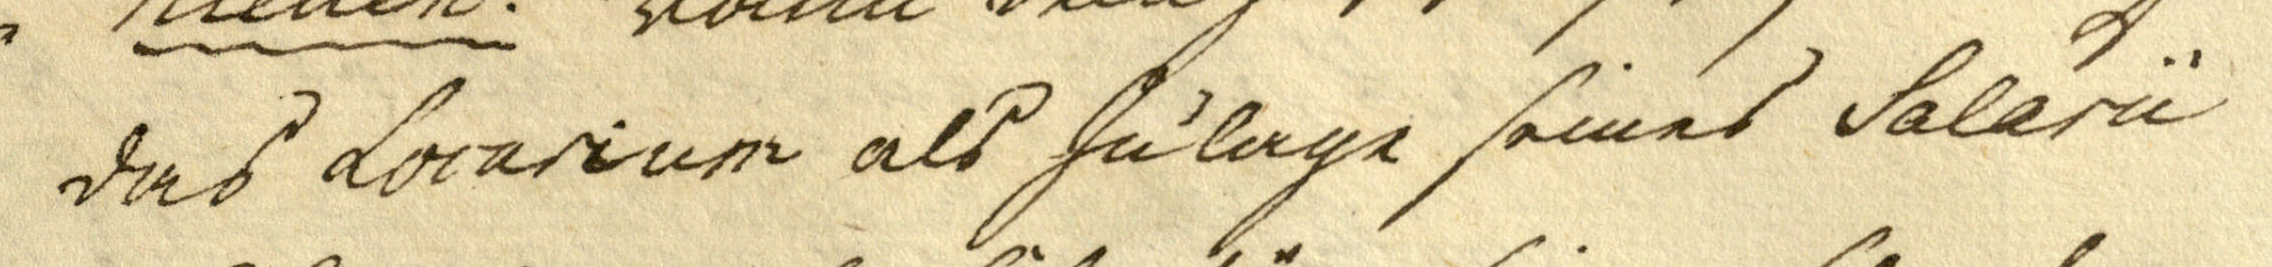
das Locarium als Zulage seines Salarii
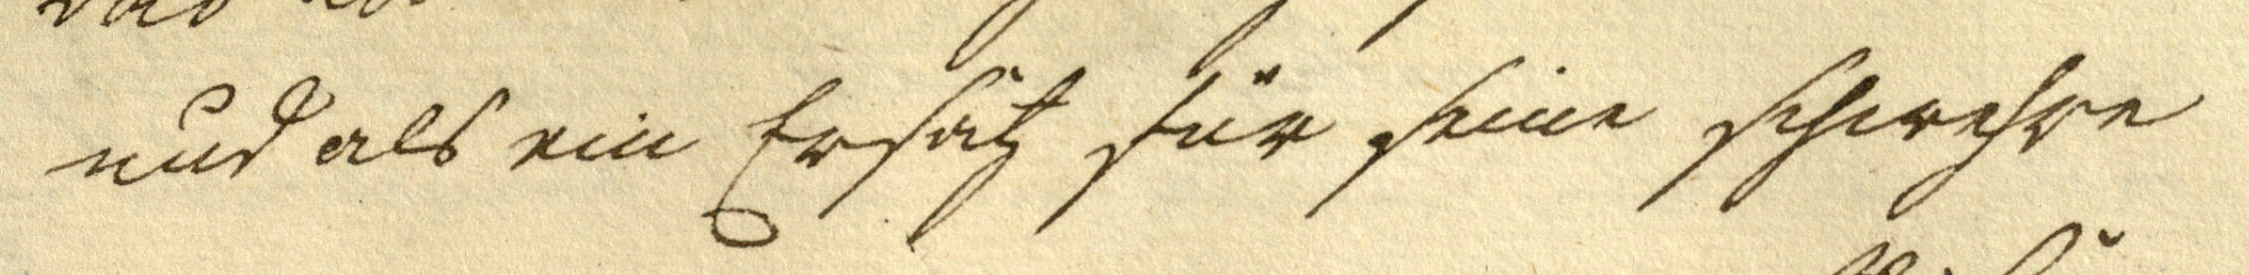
und als ein Ersatz für seine schwehre
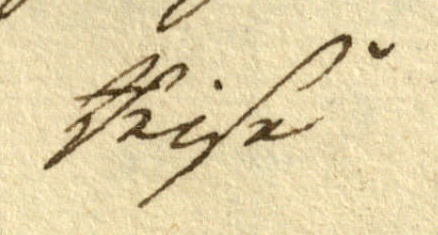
Reise
